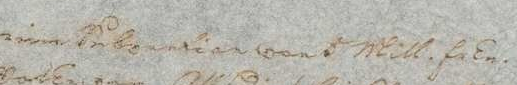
eine Subvention von 5 Mill. Frkn.
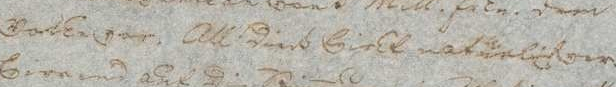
Volke vor. All dieß wirkt natürlich ver-
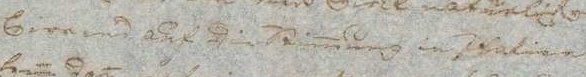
wirrend auf die Stimmung in Italien &
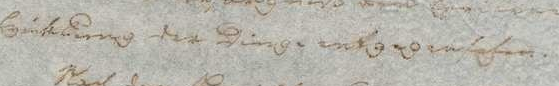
wicklung der Dinge entgegensehen.
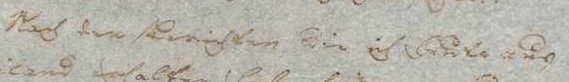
Nach den Berichten, die ich heute aus
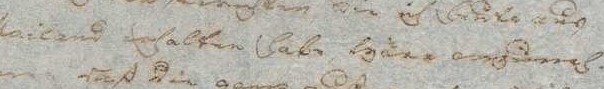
Mailand erhalten habe, wäre anzuneh-
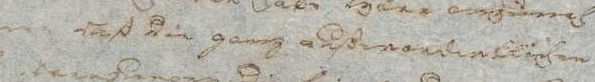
men, daß die ganz außerordentlichen
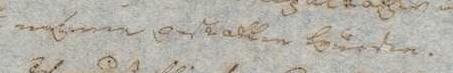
zu nehmen gestatten würden.
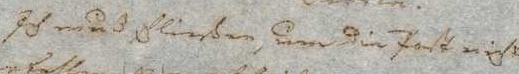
Ich muß schließen, um die Post nicht
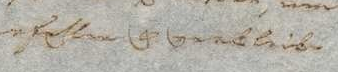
verfehlen & verbleibe
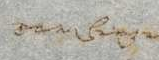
von Herzen
